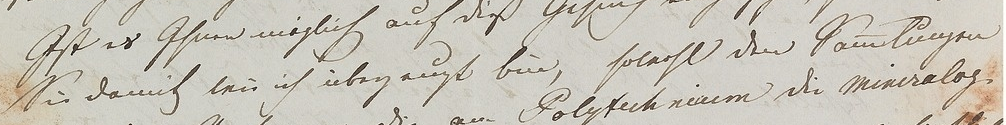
Sie damit, wie ich überzeugt bin, sowohl den Sammlungen
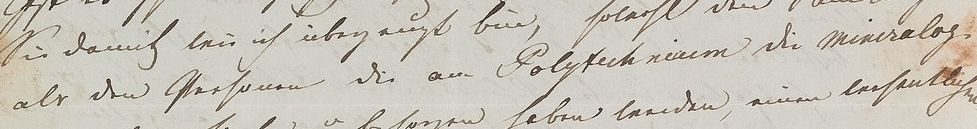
als den Personen die am Polytechnicum die mineralog.
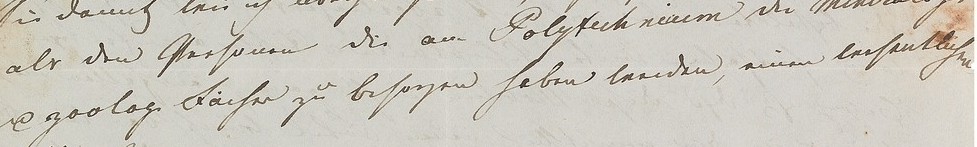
& zoolog. Fächer zu besorgen haben werden, einen wesentlichen
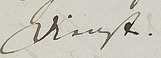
Dienst.
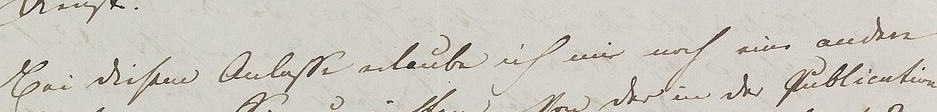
Bei diesem Anlasse erlaube ich mir noch eine andere
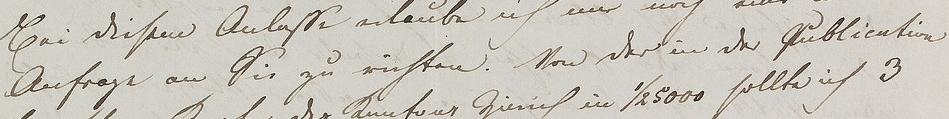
Anfrage an Sie zu richten. Von der in der Publication
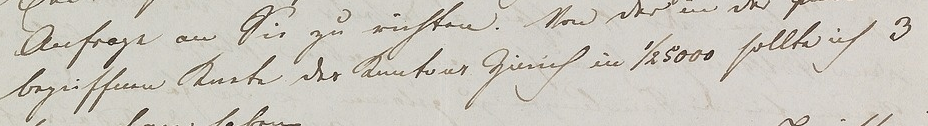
begriffnen Karte des Kantons Zürich in 1/25000 sollte ich 3
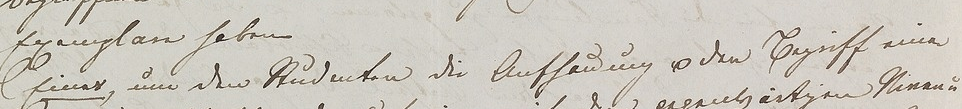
Eines, um den Studenten die Anschauung & den Begriff einer
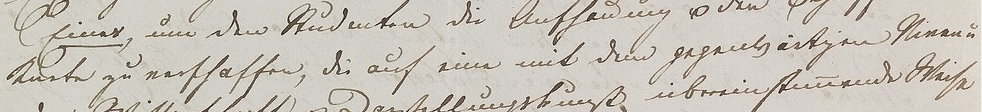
Karte zu verschaffen, die auf eine mit dem gegenwärtigen Niveau
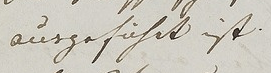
ausgeführt ist.
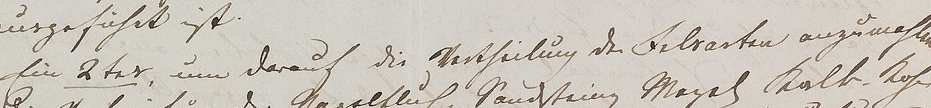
Ein 2tes, um darauf die Vertheilung der Felsarten anzumahlen
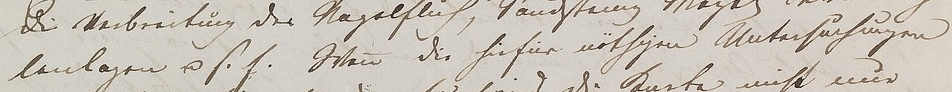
lenlagen us. f. Wenn die hiefür nöthigen Untersuchungen
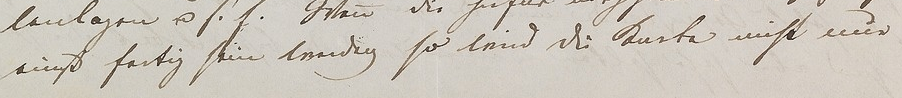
einst fertig sein werden, so wird die Karte nicht nur
